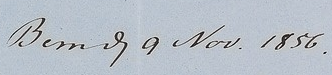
Bern den 9 Nov. 1856
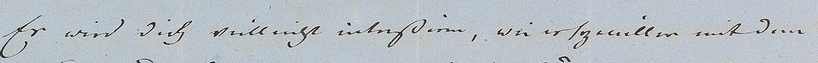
Es wird dich vielleicht intreßiren, wie es specieller mit dem
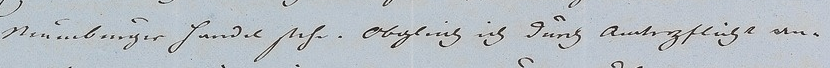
Neuenburger Handel stehe. Obgleich ich durch Amtspflicht an-
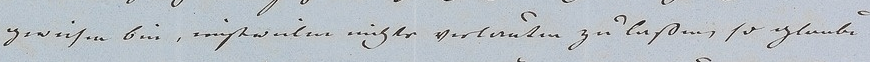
gewiesen bin, einstweilen nichts verlauten zu laßen, so glaube
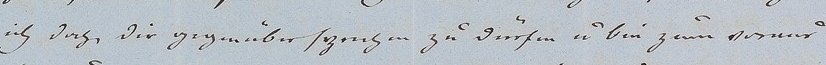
ich doch, dir gegenüber sprechen zu dürfen u bin zum voraus
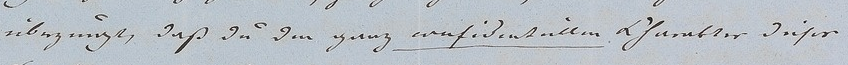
überzeugt, daß du den ganz confidentiellen Charakter dieses
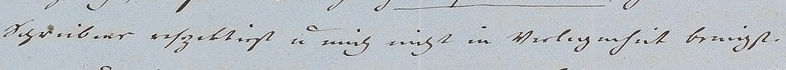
Schreibens respektirst u mich nicht in Verlegenheit bringst.
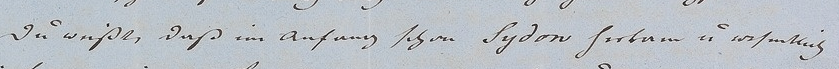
Du weißt, daß im Anfang schon Sydow herkam u wesentlich
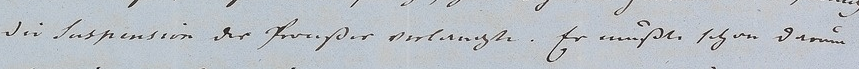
die Suspension des Proceßes verlangte. Er mußte schon darum
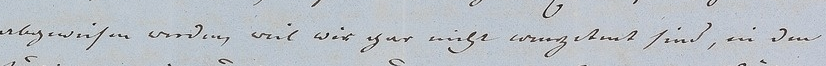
abgewiesen werden, weil wir gar nicht competent sind, in den
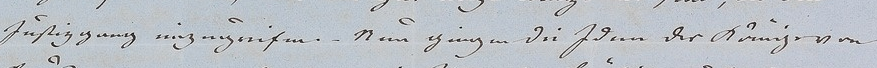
Justizgang einzugreifen. – Nun gingen die Ideen des Königs von
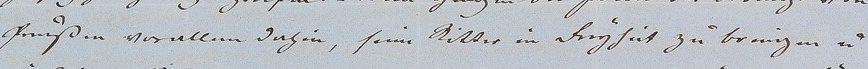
Preußen vor allem dahin, seine Ritter in Freyheit zu bringen u
